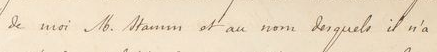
de moi M. Stamm et au nom desquels il n´a
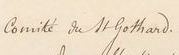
Comité du St Gothard.
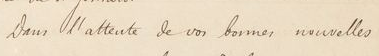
Dans l´attente de vos bonnes nouvelles
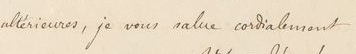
ultérieures, je vous salue cordialement
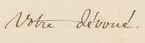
Votre dévoué.
